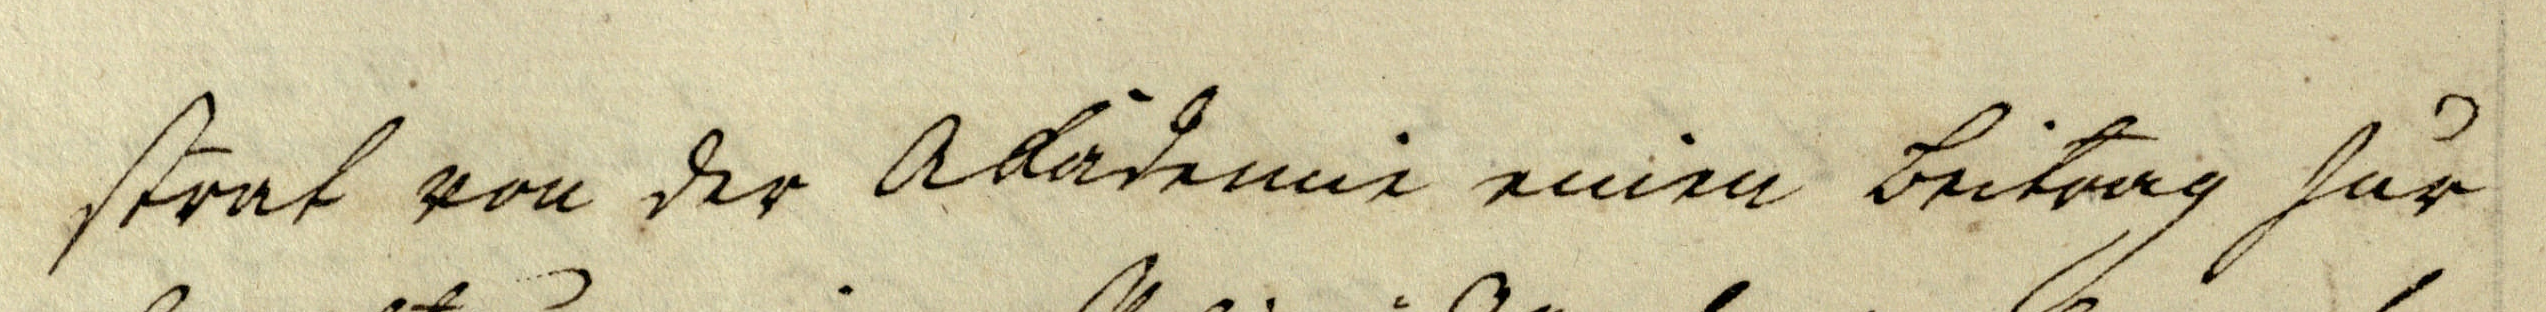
strat von der Akademie einen Beitrag zur
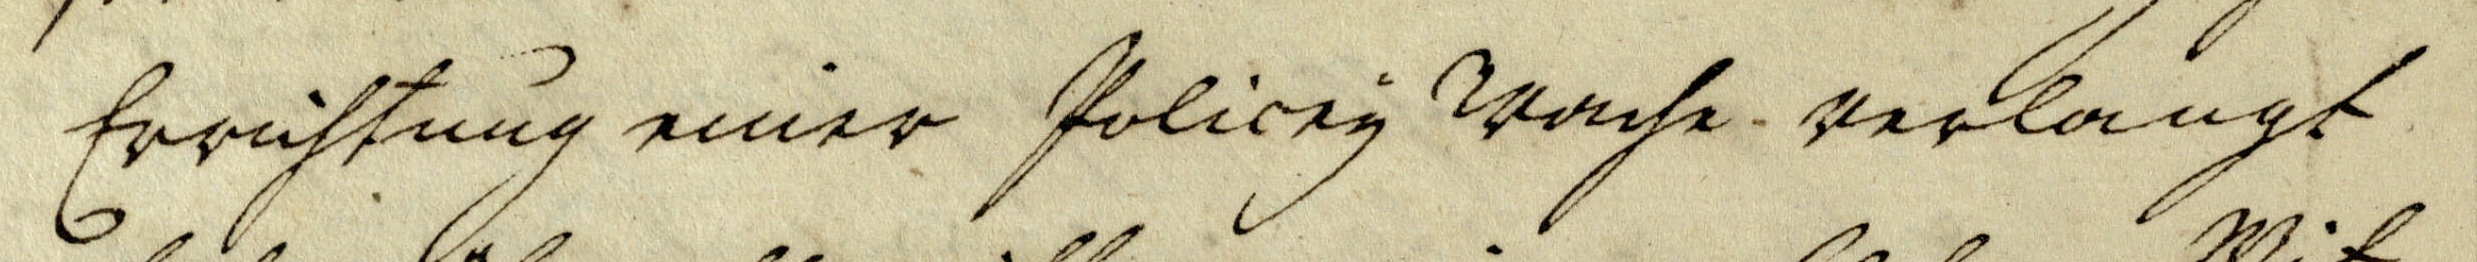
Errichtung einer Policeÿ Wache verlangt
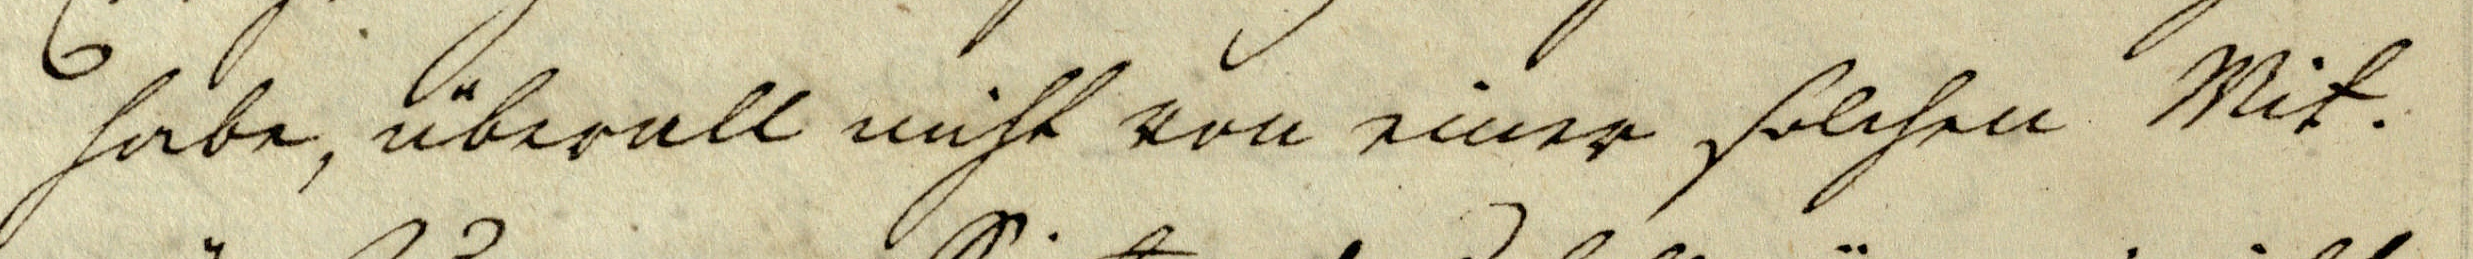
habe, überall nicht von einer solchen Mit¬
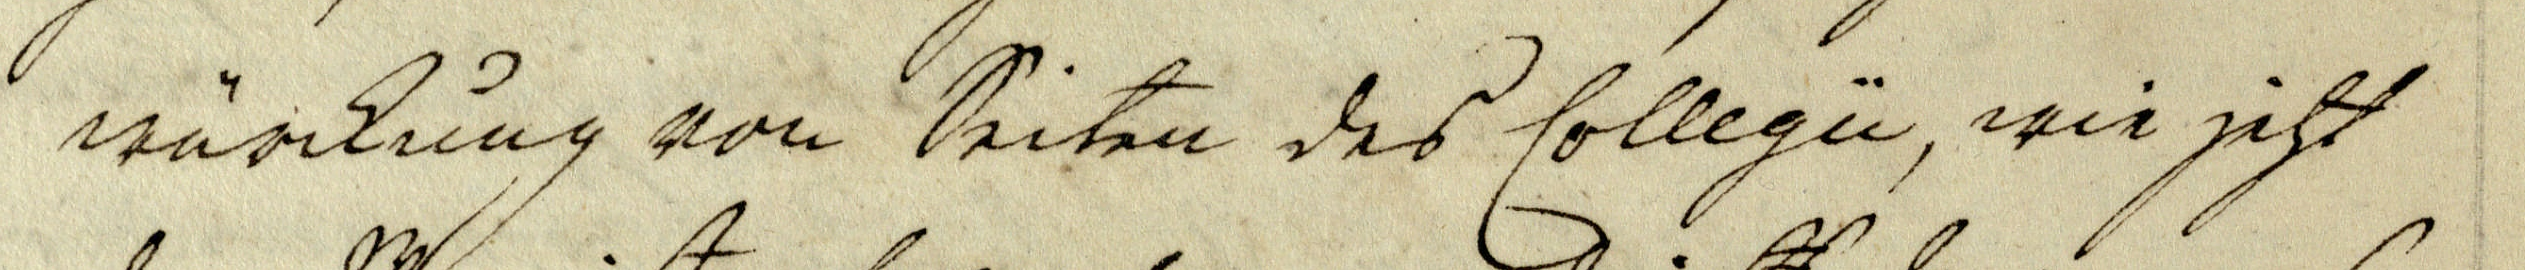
würckung von Seiten des Collegii, wie jetzt
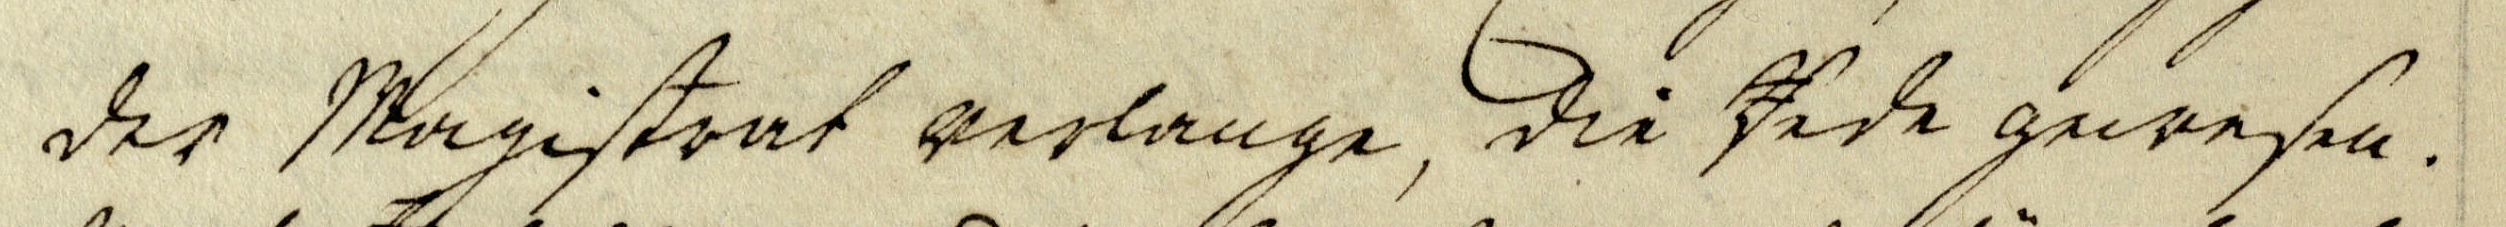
der Magistrat verlange, die Rede gewesen.
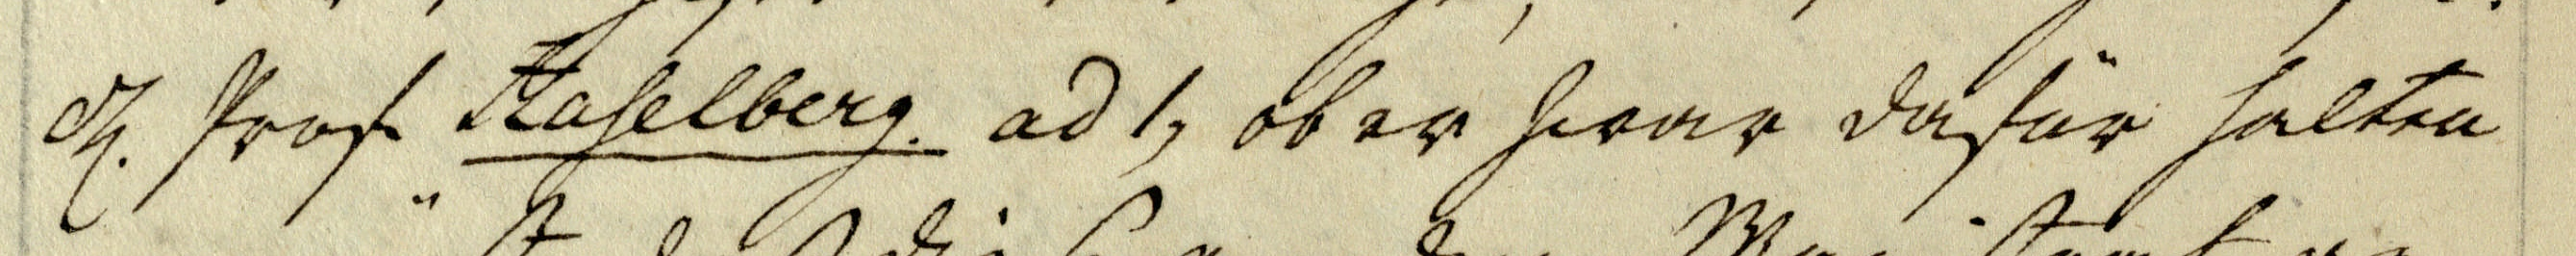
dh. Prof. Haselberg ad 1., ob er zwar dafür halten
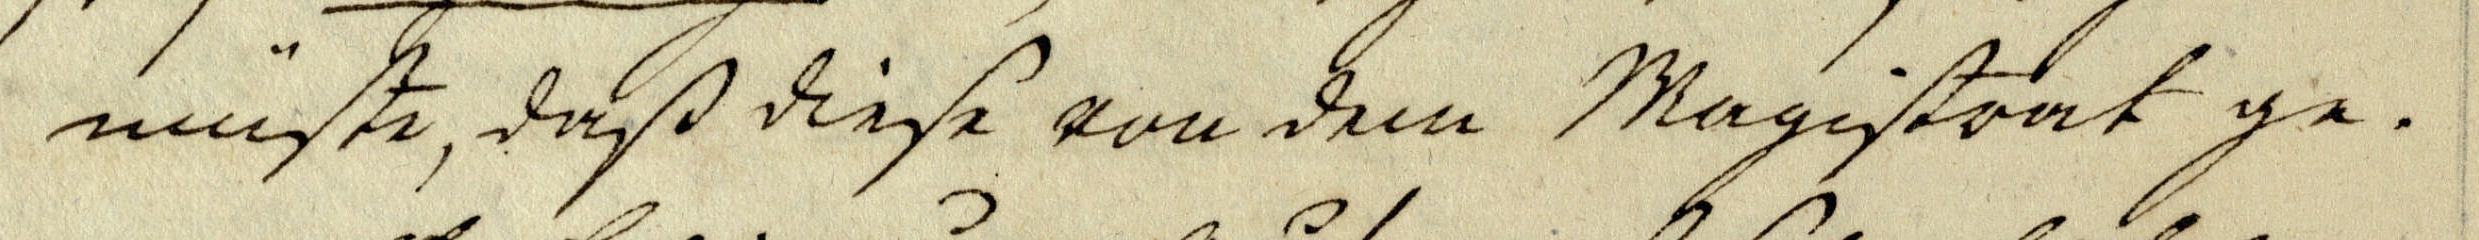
müßte, daß diese von dem Magistrat ge¬
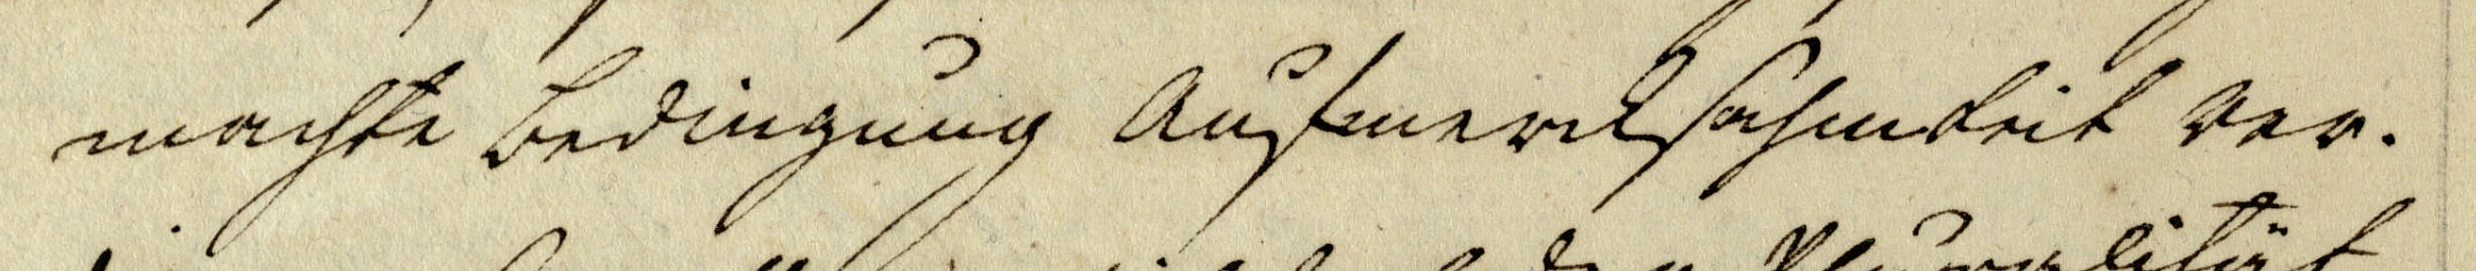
machte Bedingung Aufmercksahmkeit ver¬
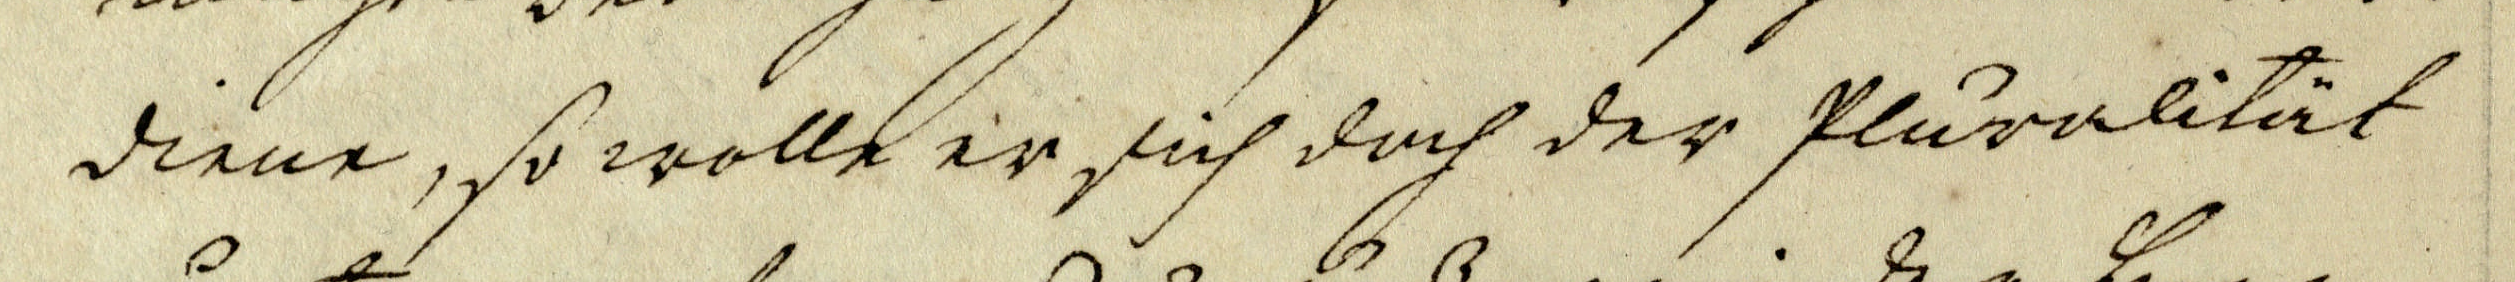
diene, so wolle er sich doch der Pluralität
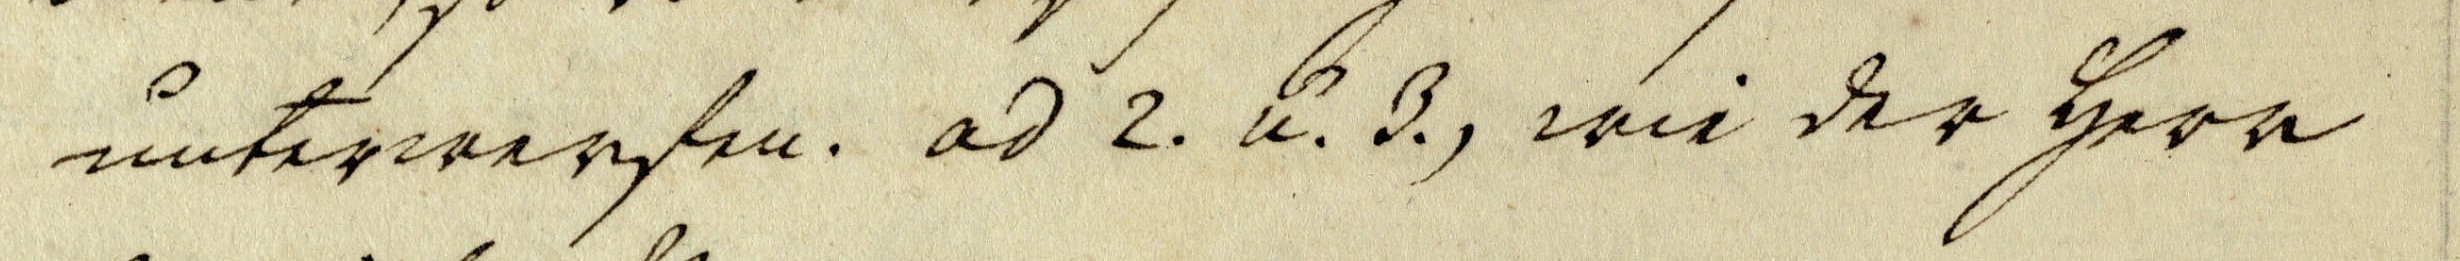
unterwerfen. ad 2. u. 3., wie der Herr
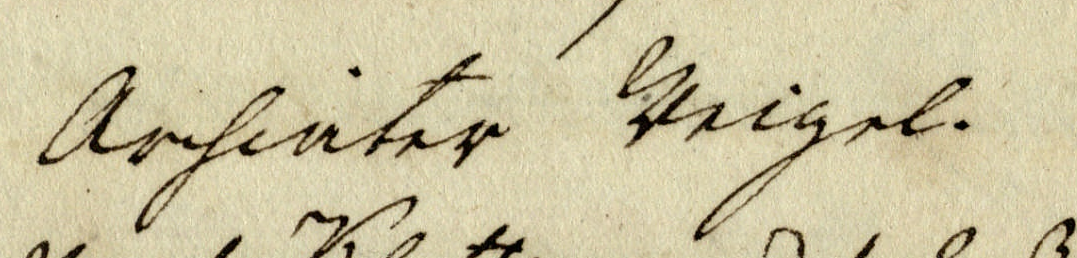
Archiater Weigel.
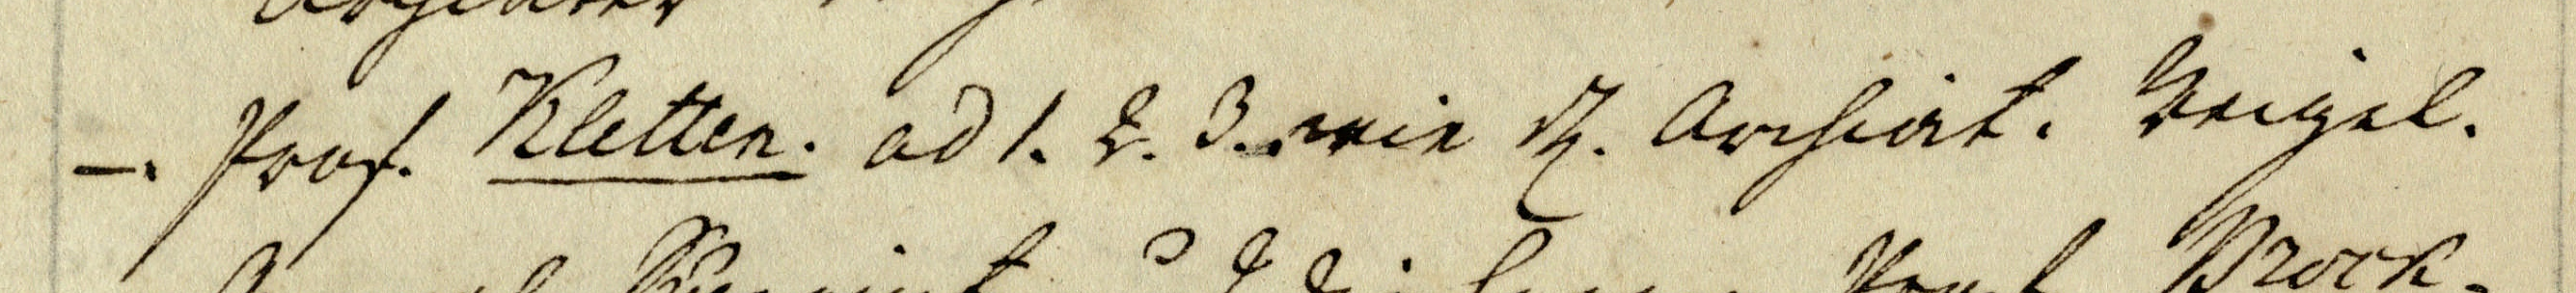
Prof. Kletten. ad 1. 2. 3. wie dh. Archiat. Weigel.
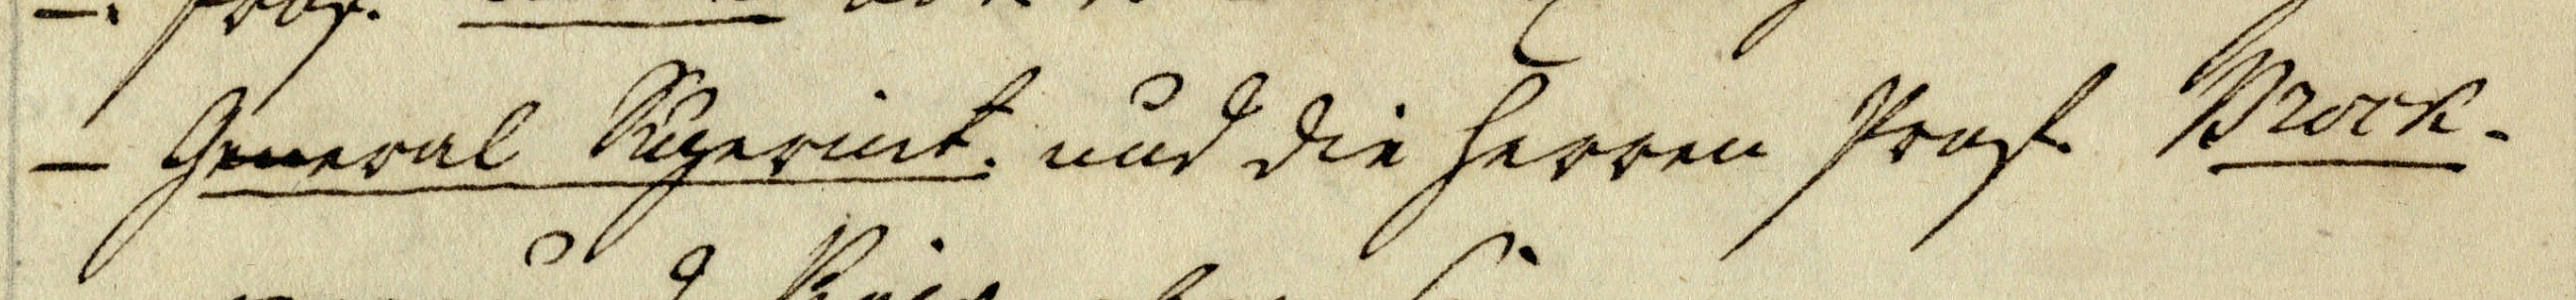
General Superint. und die Herren Prof. Brock¬
